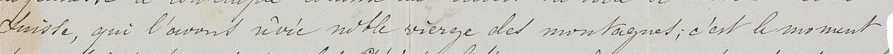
Suisse, qui l'avons rêvée noble vierge des montagnes; c'est le moment
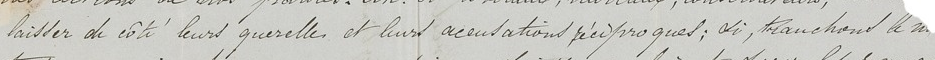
laisser de côté leurs querelles et leurs accusations réciproques; si, tranchons le nœud,
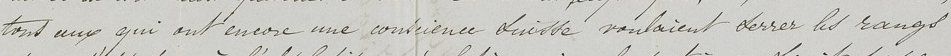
tous ceux qui ont encore une conscience suisse voulaient serrer les rangs
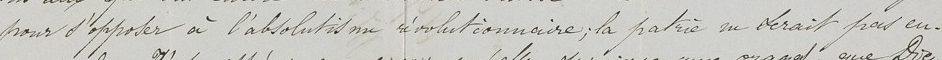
pour s'opposer à l'absolutisme révolutionnaire; la patrie ne serait pas en-
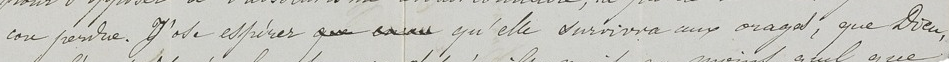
core perdue. J'ose espérer que... qu'elle survivra aux orages; que Dieu,
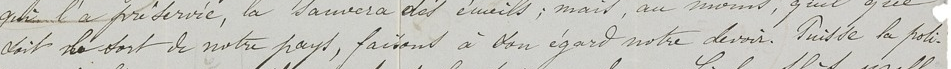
soit le sort de notre pays, faisons à son égard notre devoir. Puisse la poli-
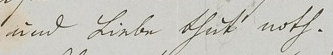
und Liebe thut noth.
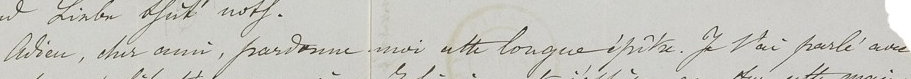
Adieu, cher ami, pardonne-moi cette longue épître. Je t'ai parlé avec
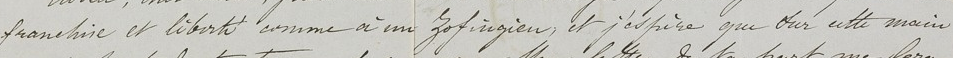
franchise et liberté comme à un Zofingien; et j'espère que sur cette main
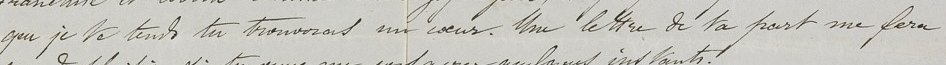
que je te tends tu trouveras un cœur. Une lettre de ta part me fera
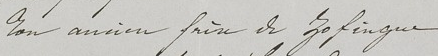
Ton ancien frère de Zofingen
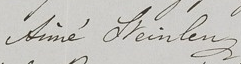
Aimé Steinlen
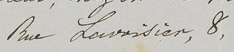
Rue Lavoisier, 8,
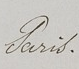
Paris.
